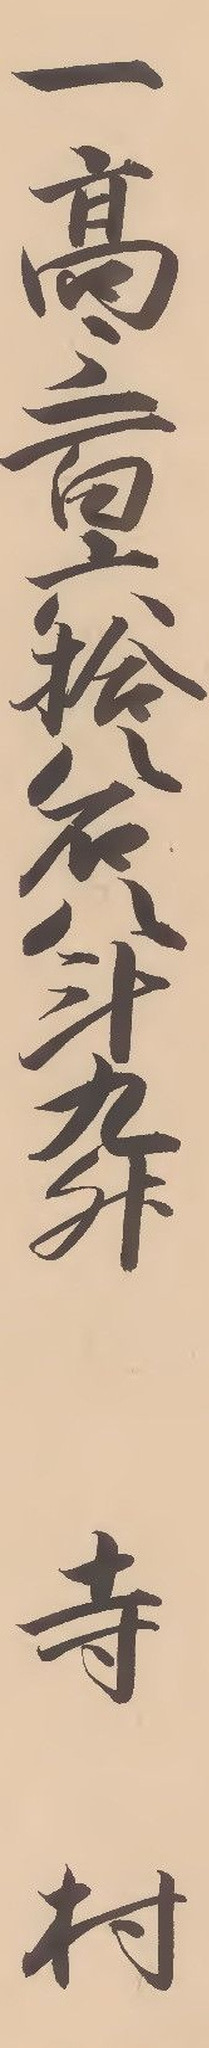一高三百六拾八石八斗九升寺村
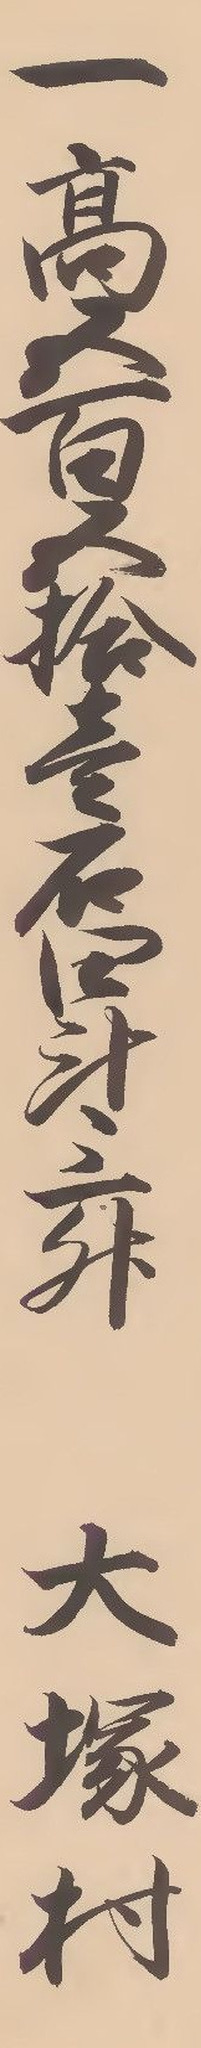一高五百五拾壱石四斗三升大塚村

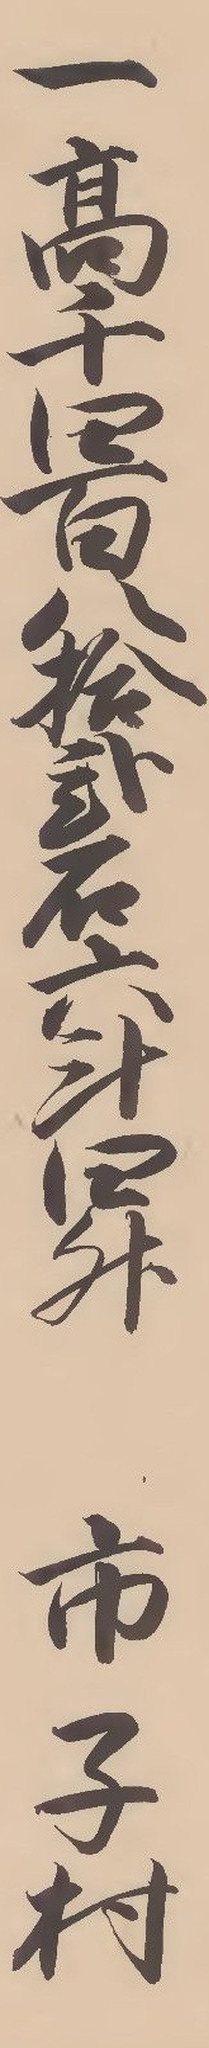一高千四百八拾弐石六斗四升市子村
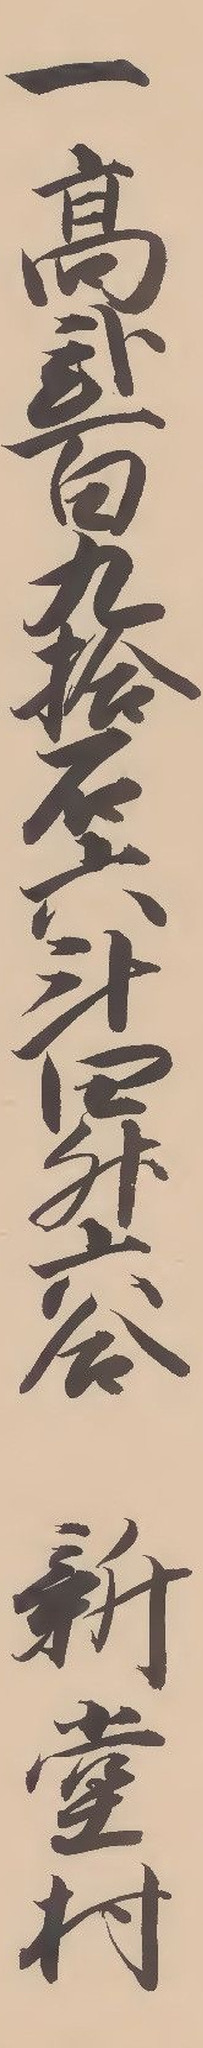一高弐百九拾石六斗四升六合新堂村
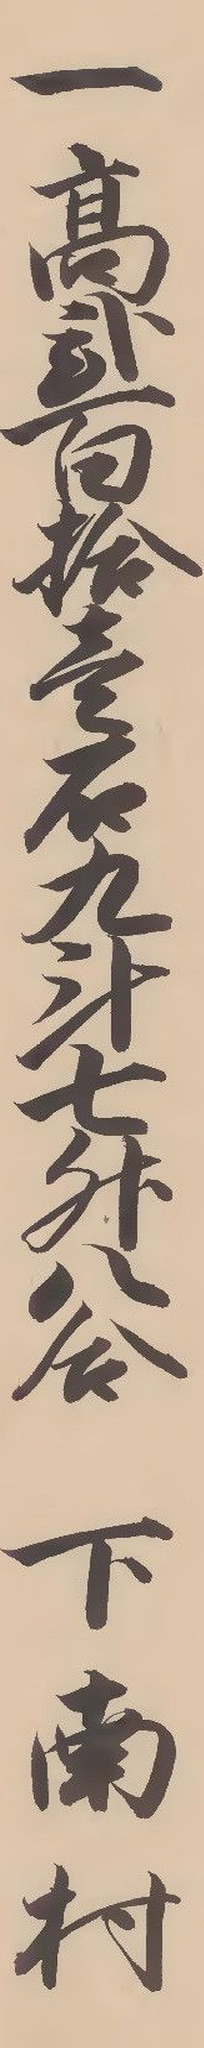一高弐百拾壱石九斗七升八合下南村
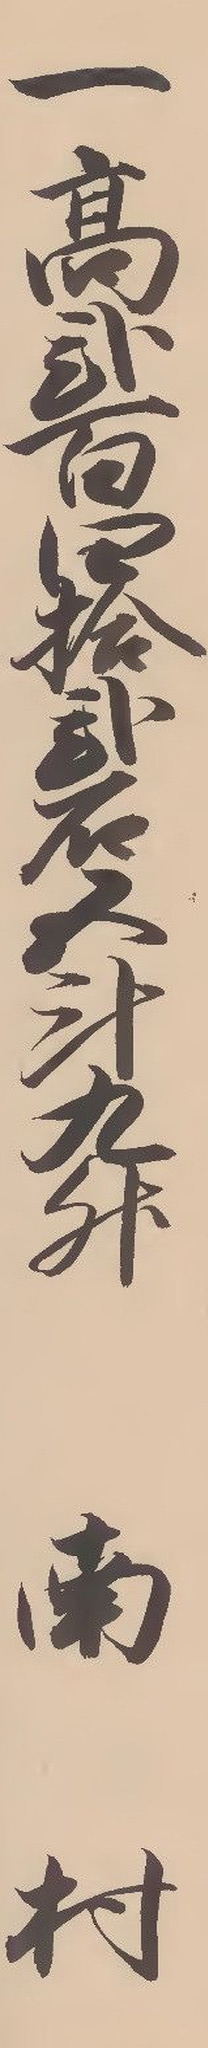一高弐百四拾弐石五斗九升南村
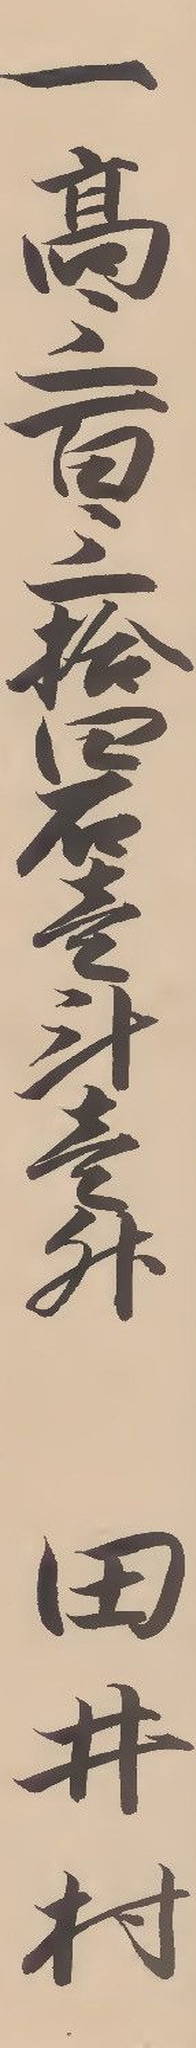一高三百三拾四石壱斗壱升田井村
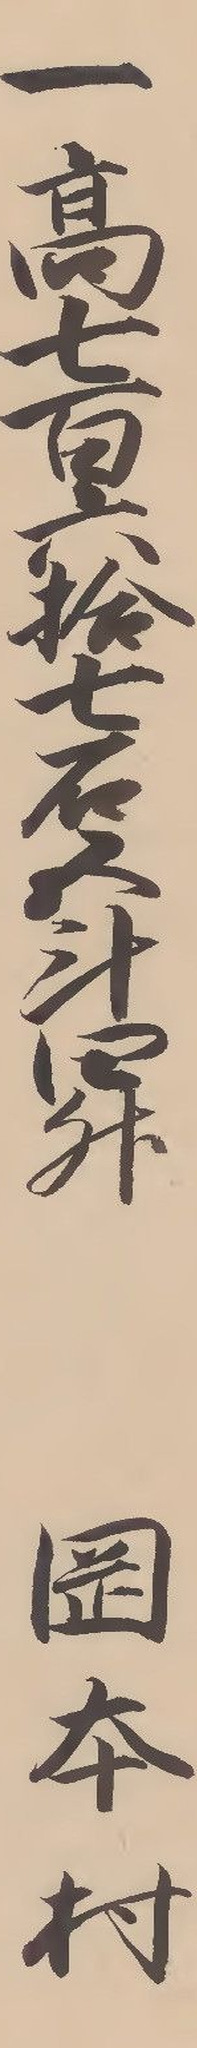一高七百六拾七石五斗四升岡本村
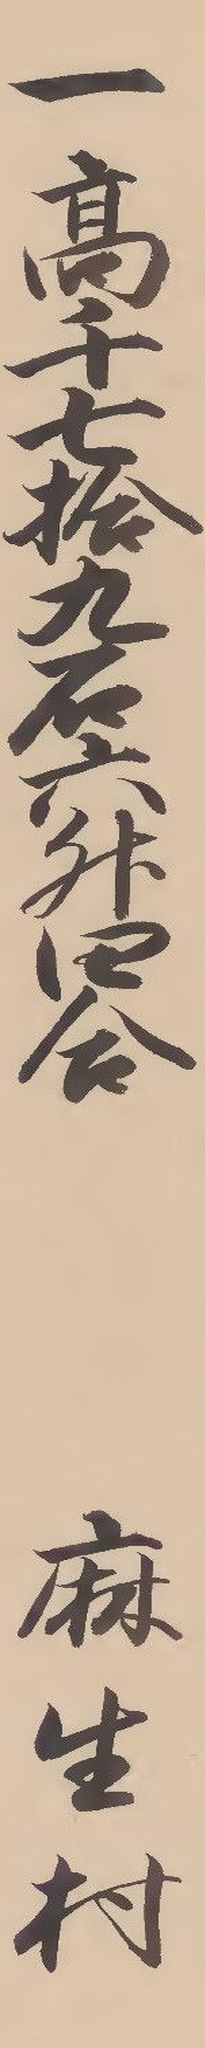一高千七拾九石六升四合麻生村
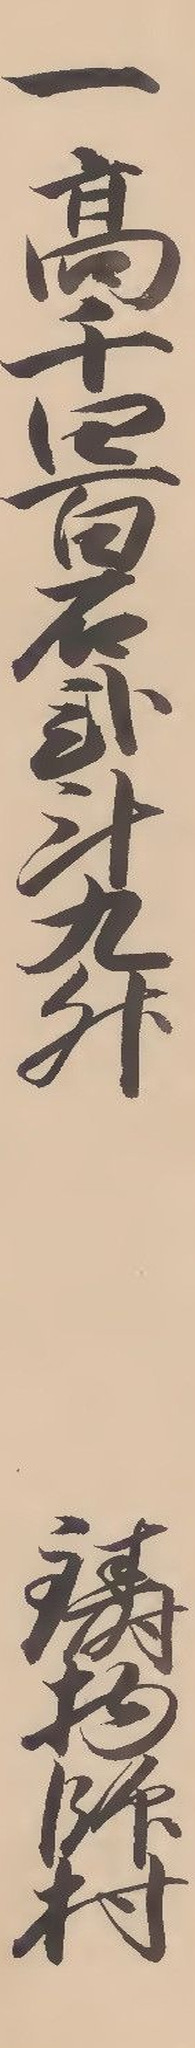一高千四百石弐斗九升鋳物師村

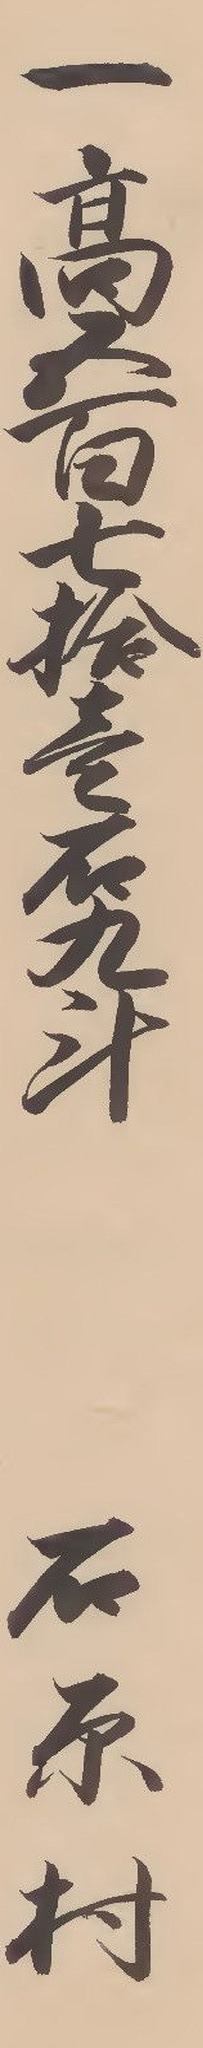一高五百七拾壱石九斗石原村
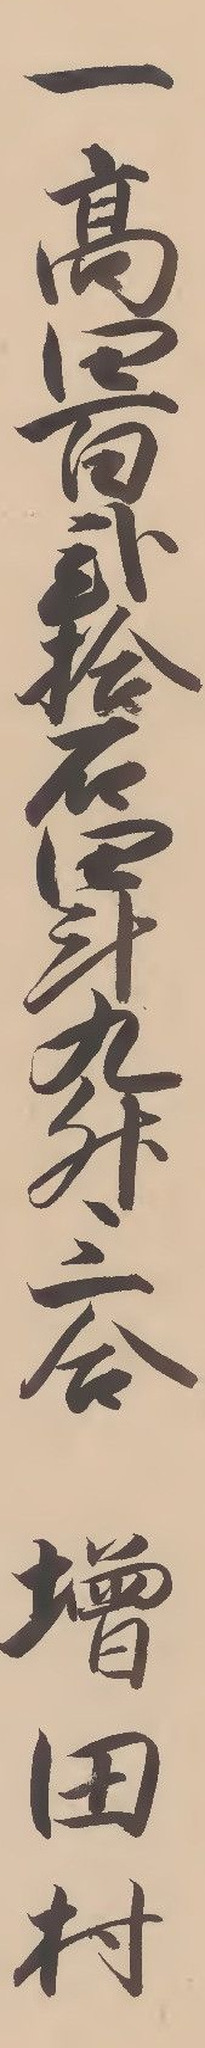一高四百弐拾石四斗九升三合増田村
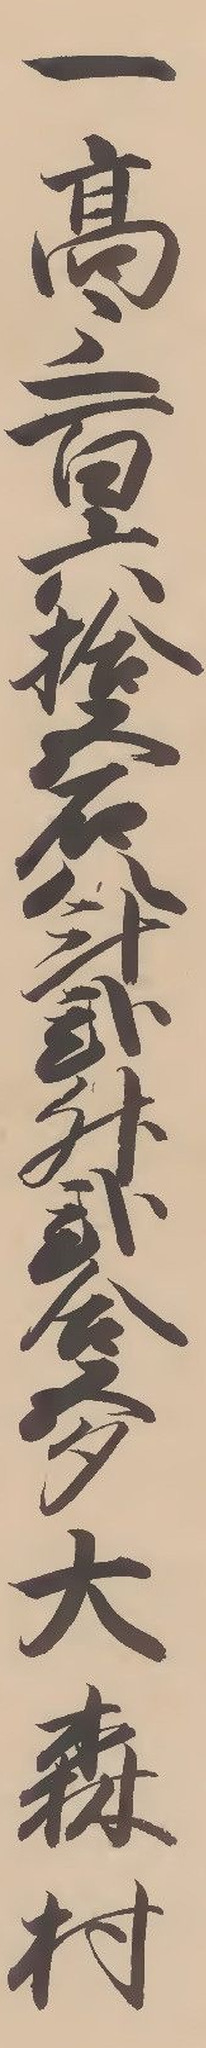一高三百六捨五石八斗弐升弐合五勺大森村
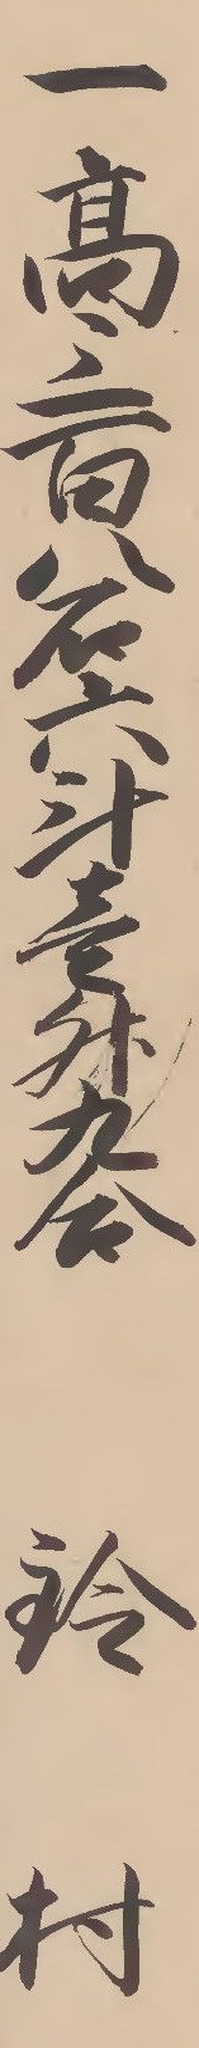一高三百八石六斗壱升九合鈴村
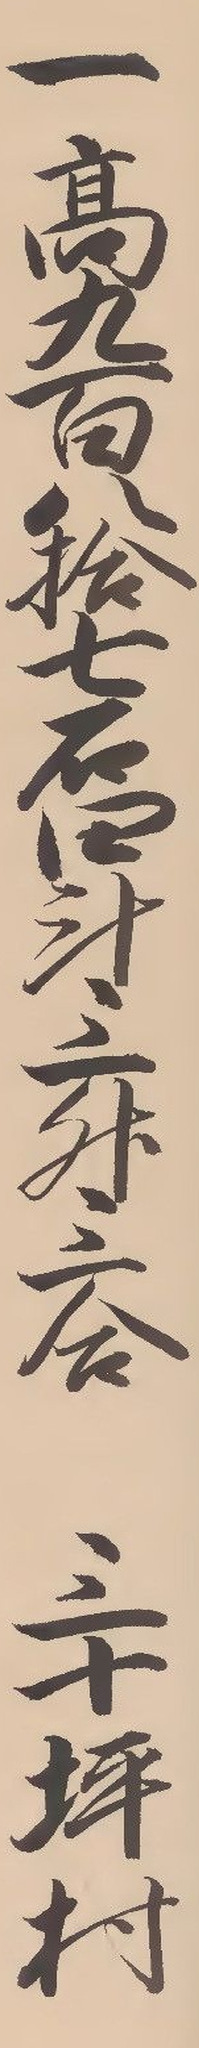一高九百八拾七石四斗三升三合三十坪村
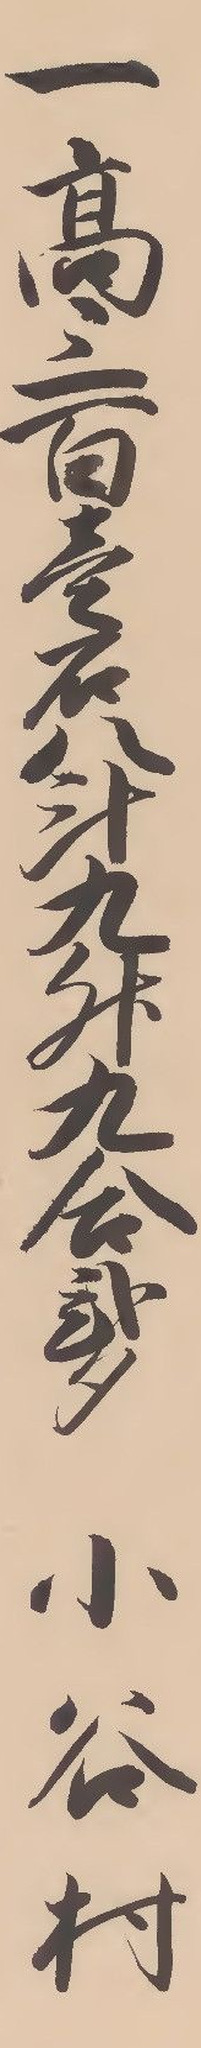一高三百壱石八斗九升九合弐勺小谷村
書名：近江国郷帳
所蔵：国立公文書館 National Archives of Japan
